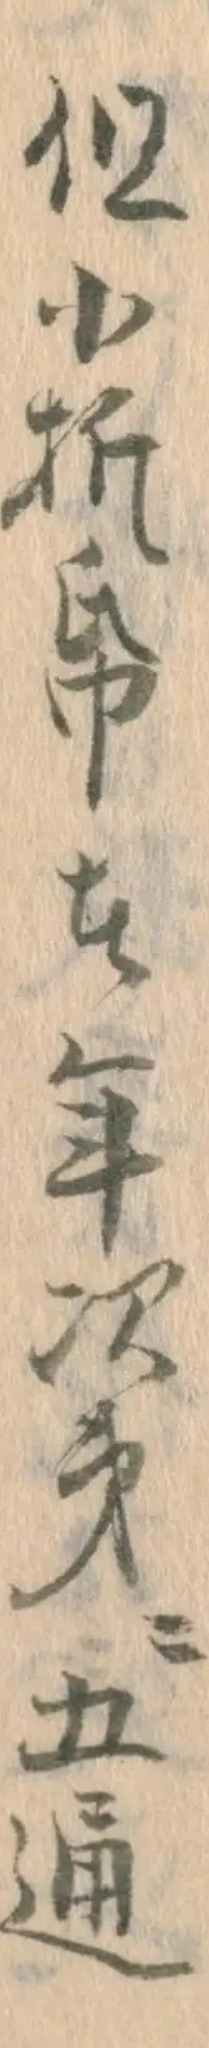但小折紙は年次第ニ五通
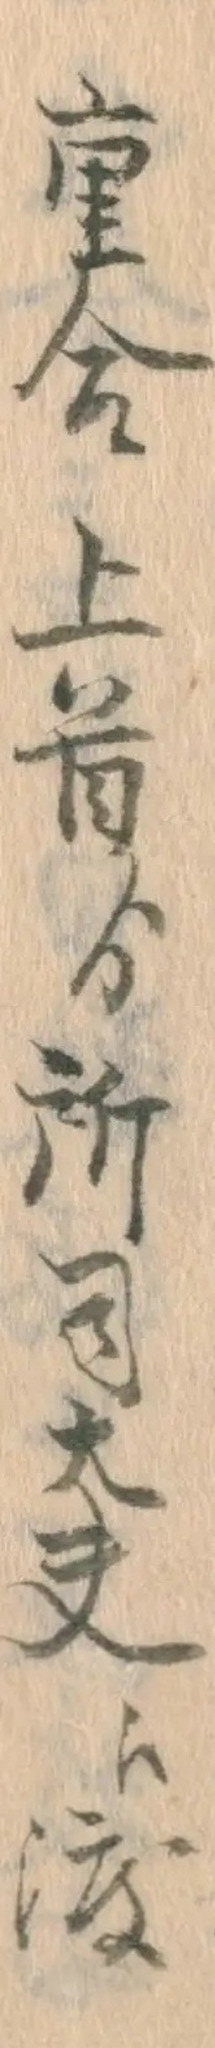重合上首ゟ所司大夫え渡
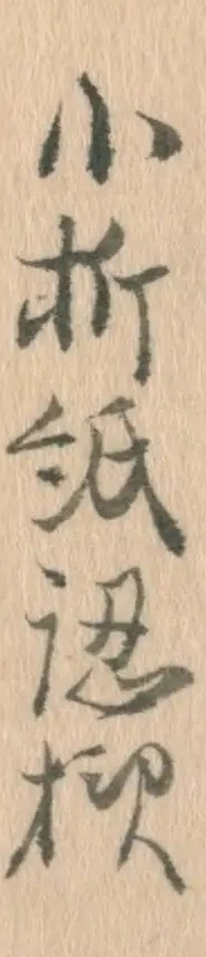小折紙認様
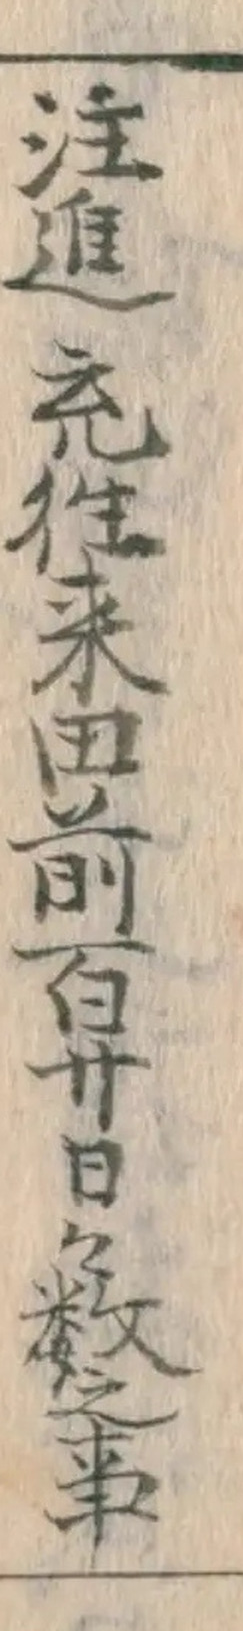注進充往来田前百廿日々数之事
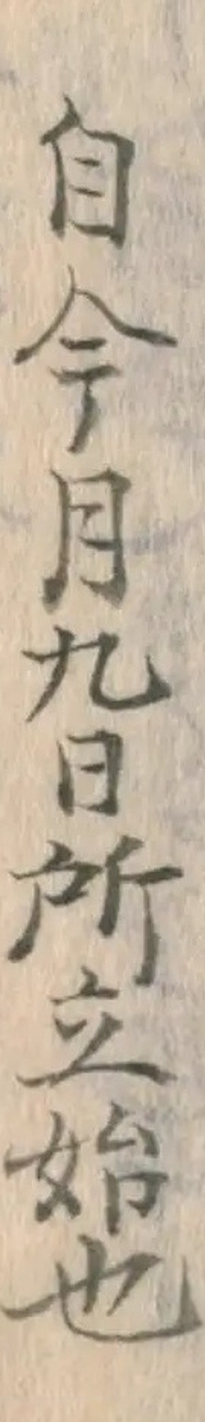自今月九日所立始也
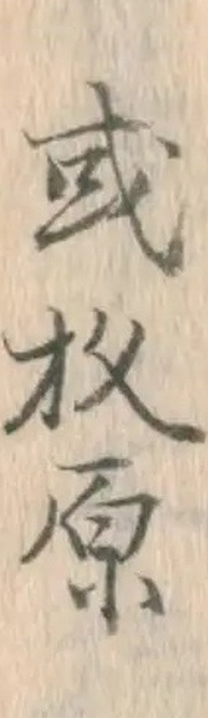或杦原
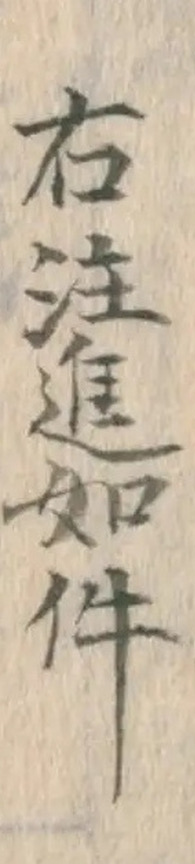右注進如件
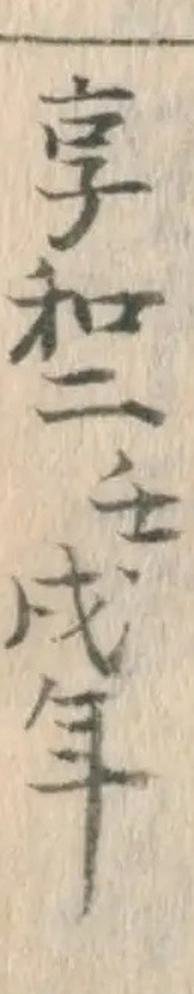享和二壬戌年
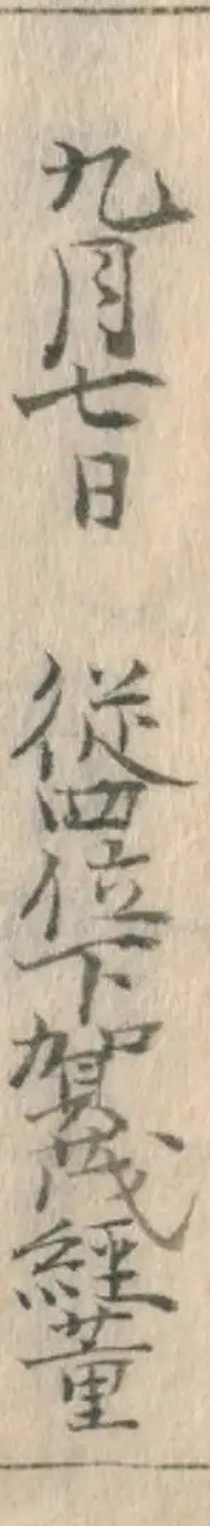九月七日従四位下賀茂経董

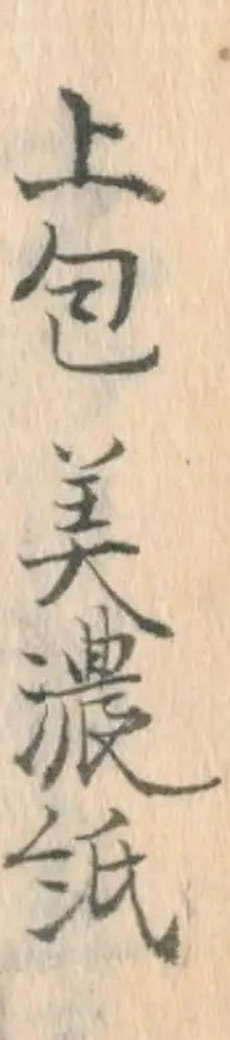上包美濃紙
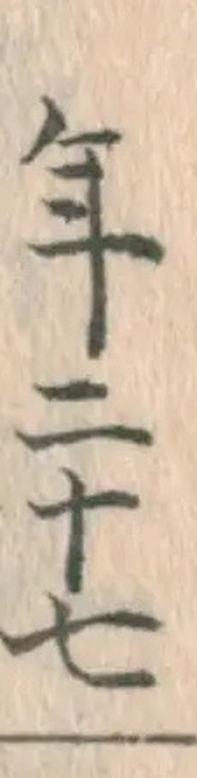年二十七
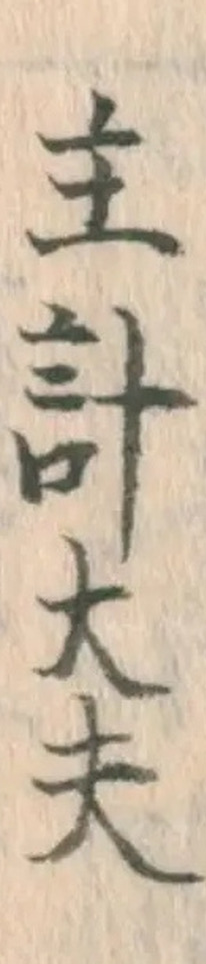主計大夫
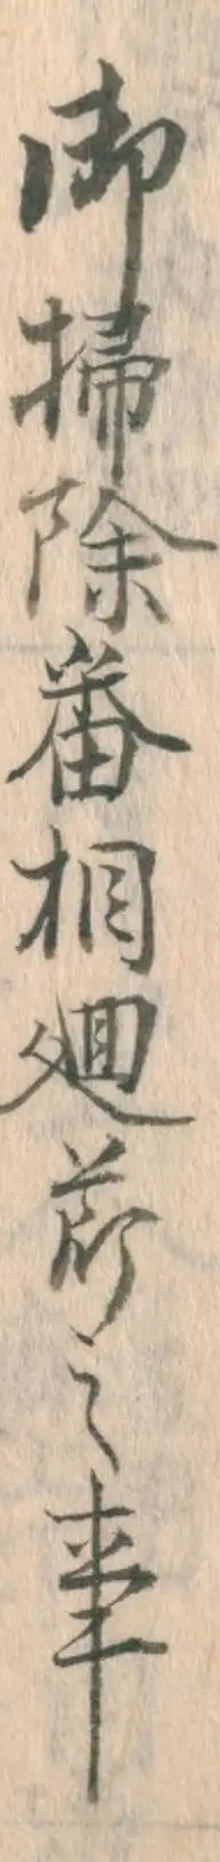御掃除番相廻節之事
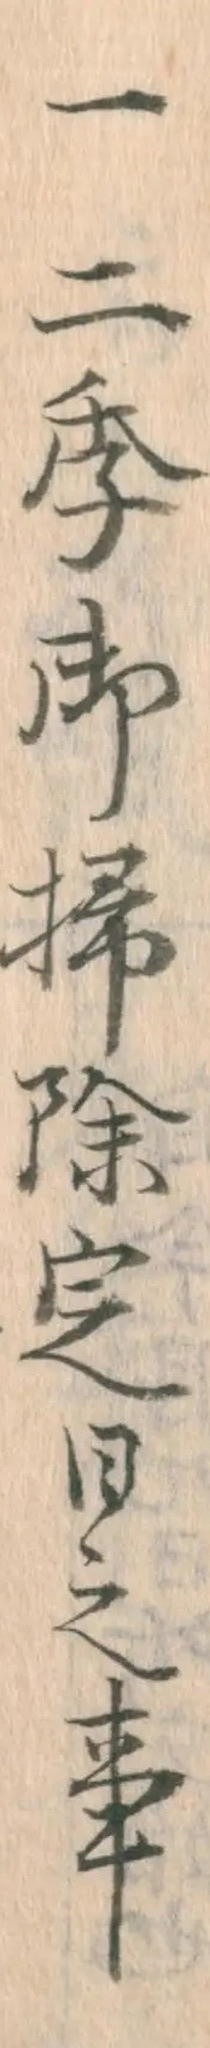一二季御掃除定日之事
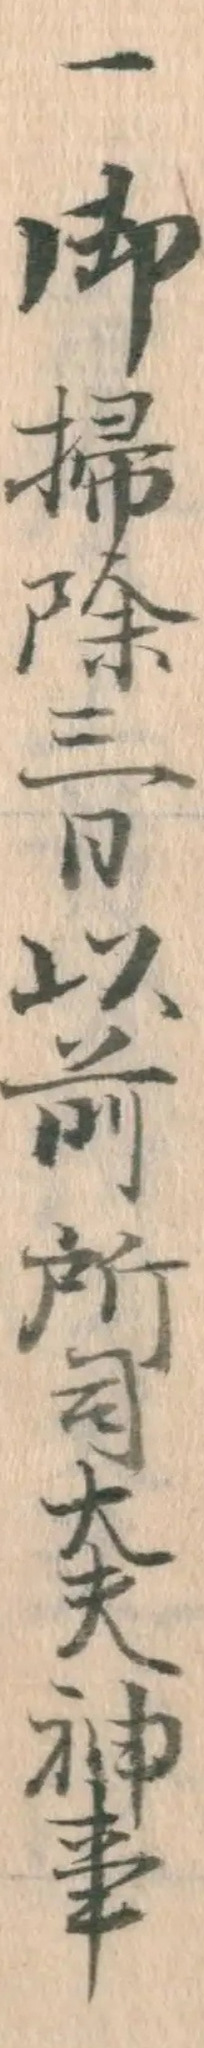一御掃除三日以前所司大夫神事
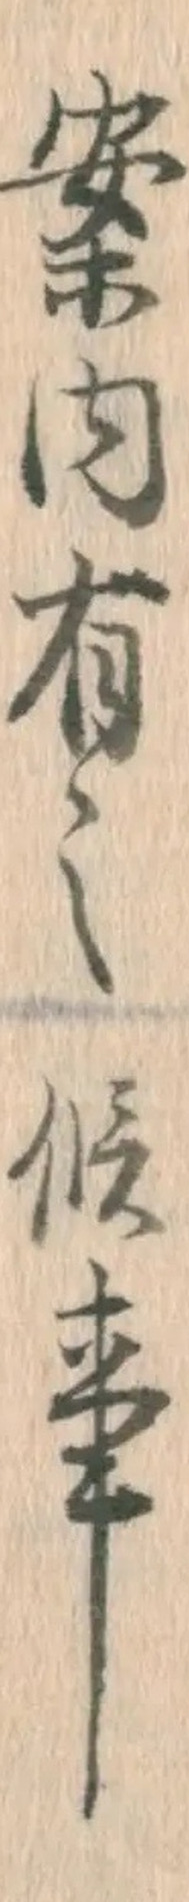案内有之候事
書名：賀茂社記録. 第81冊
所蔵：国立国会図書館 National Diet Library, JAPAN
